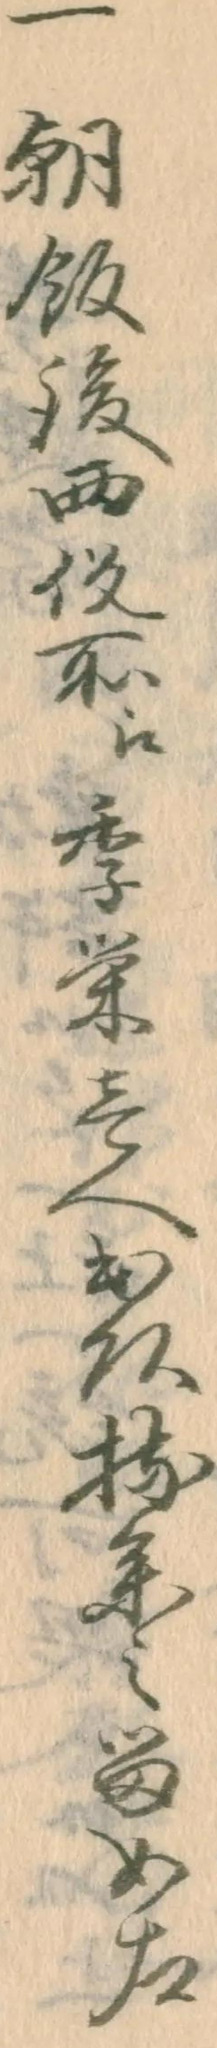一朝飯後西役所江季栄壱人出頭持参之留如左
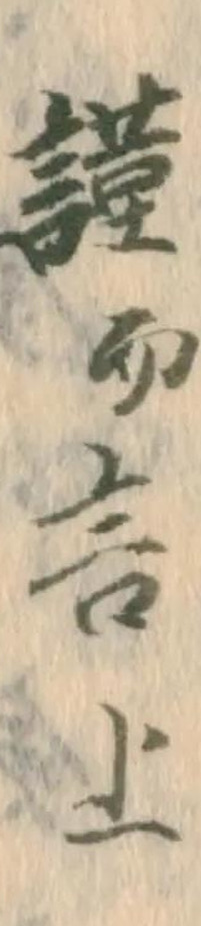謹而言上
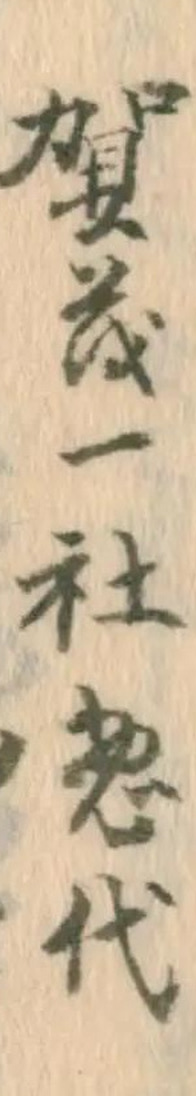賀茂一社惣代
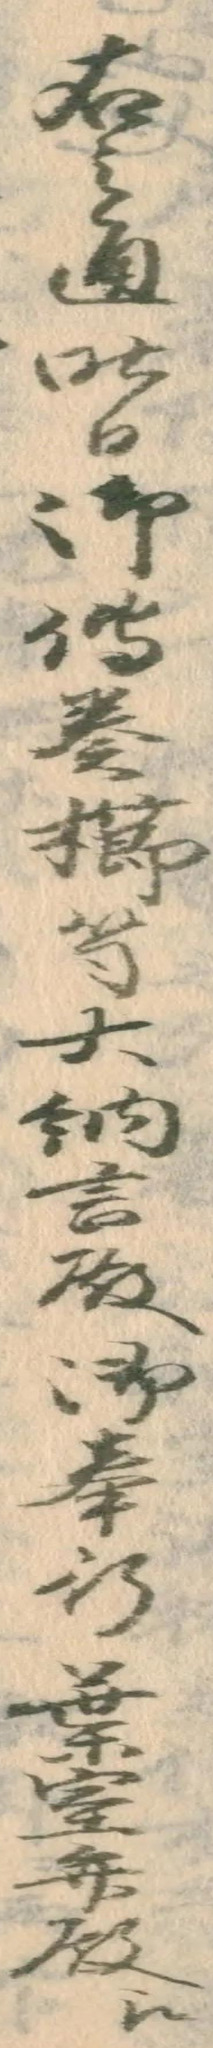右之通昨日御伝奏櫛笥大納言殿御奉行葉室弁殿江
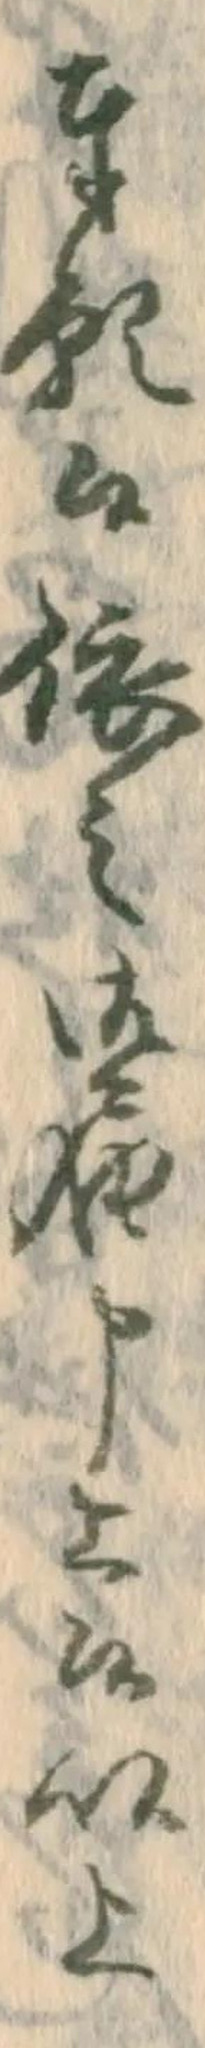奉願候依之御届申上候以上
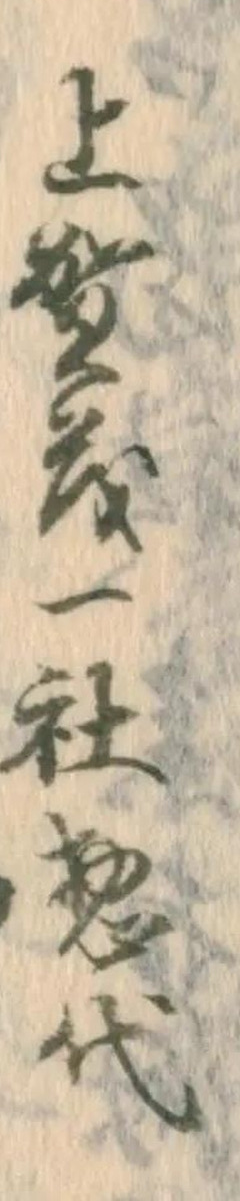上賀茂一社惣代
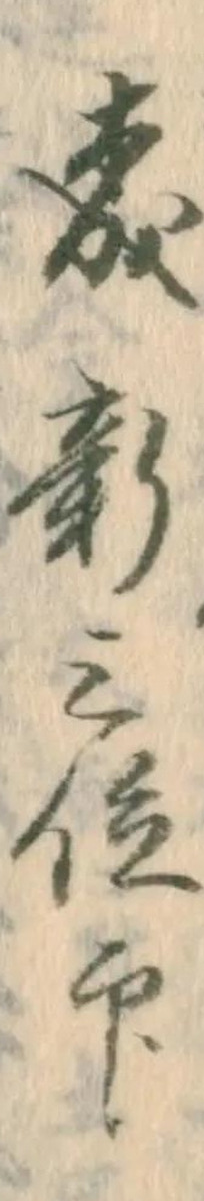森新三位印
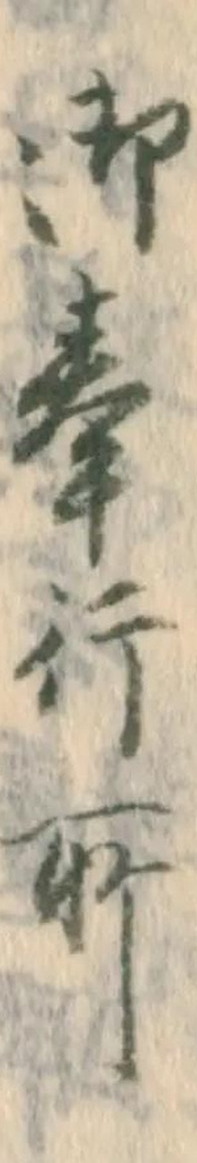御奉行所
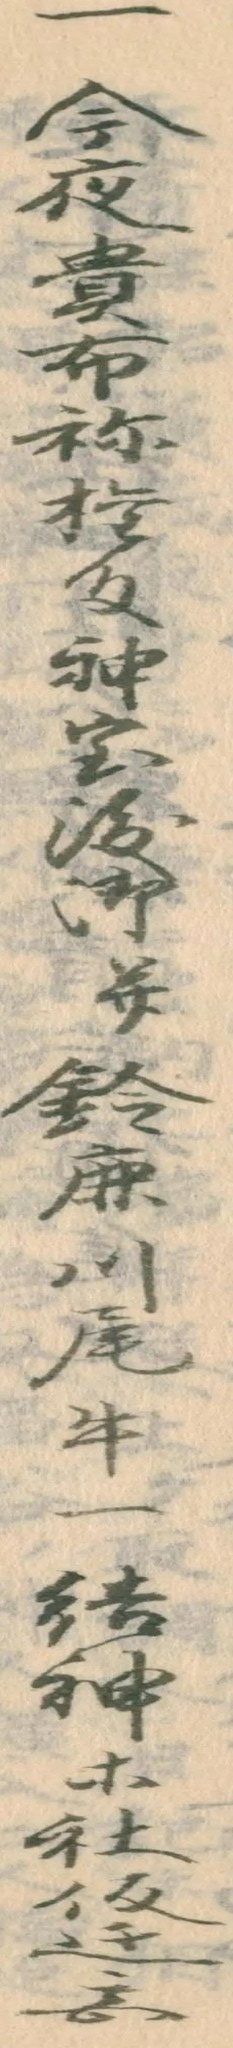一今夜貴布祢権殿神宝渡御并鈴鹿川尾牛一結神等社仮迁宮
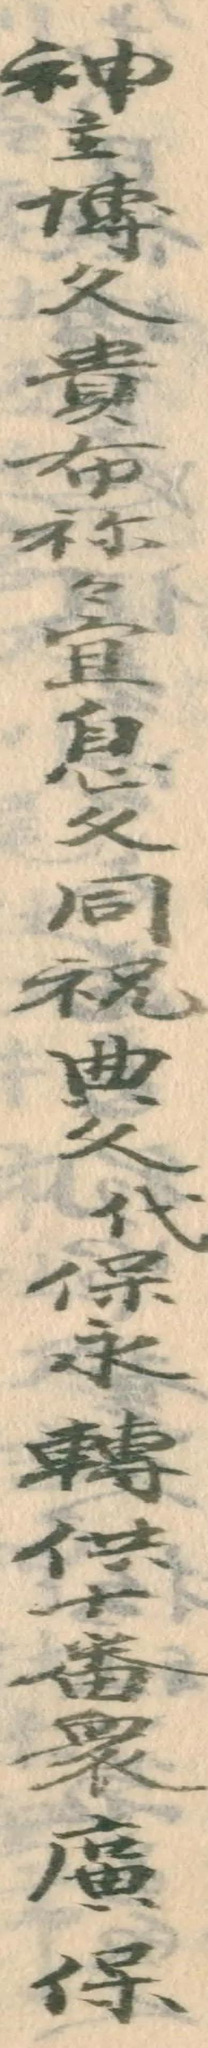神主博久貴布祢々宜息久同祝典久代保永転供十番衆広保

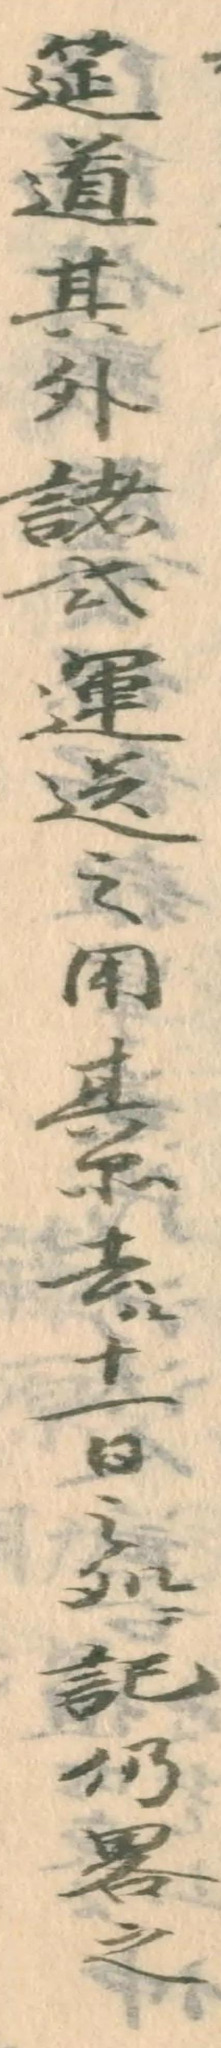筵道其外諸式運送之用其品去ル十一日之処ニ記仍略之
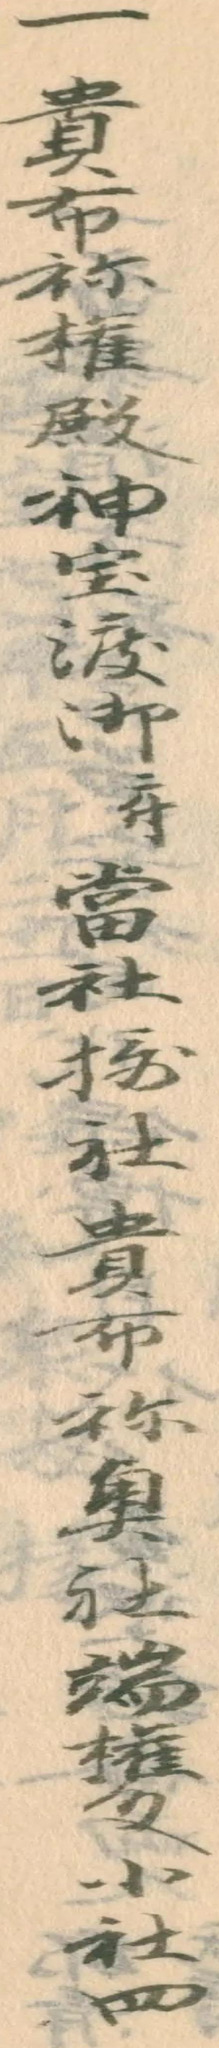一貴布祢権殿神宝渡御ニ付当社摂社貴布祢奥社端権殿小社四
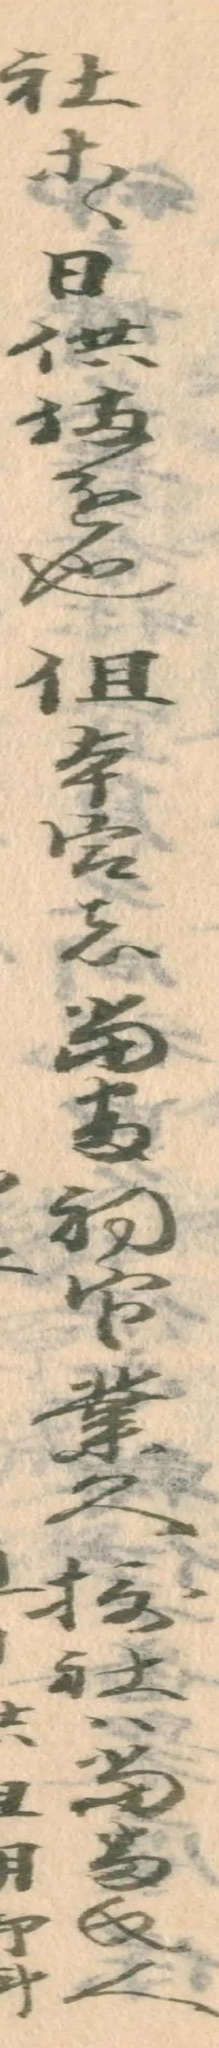社等へ日供備進也但本宮は当番祠官業久摂社ハ当番氏人
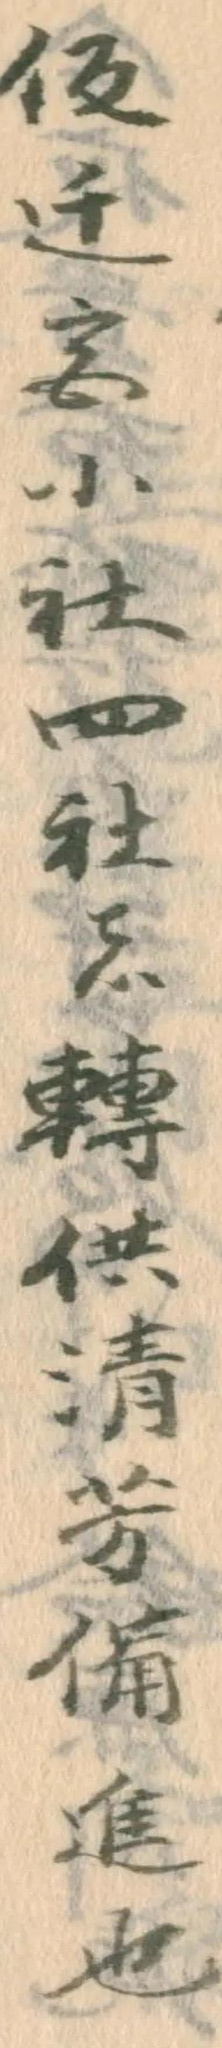仮迁宮小社四社は転供清芳備進也
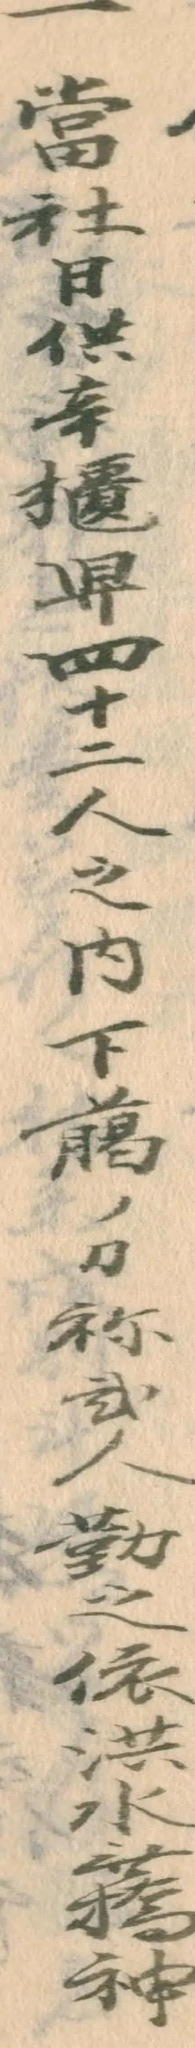一当社日供辛櫃舁四十二人之内下臈ノ刀祢弐人勤之依洪水無橋神
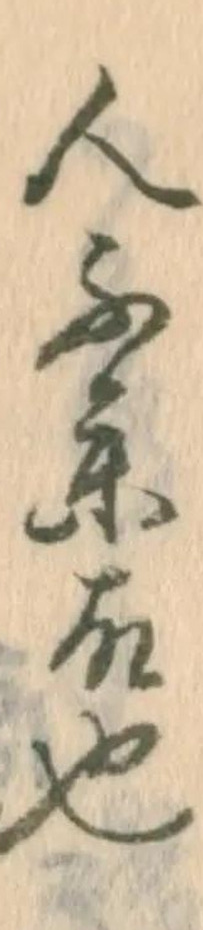人不参故也
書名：賀茂社記録. 第17冊
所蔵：国立国会図書館 National Diet Library, JAPAN
